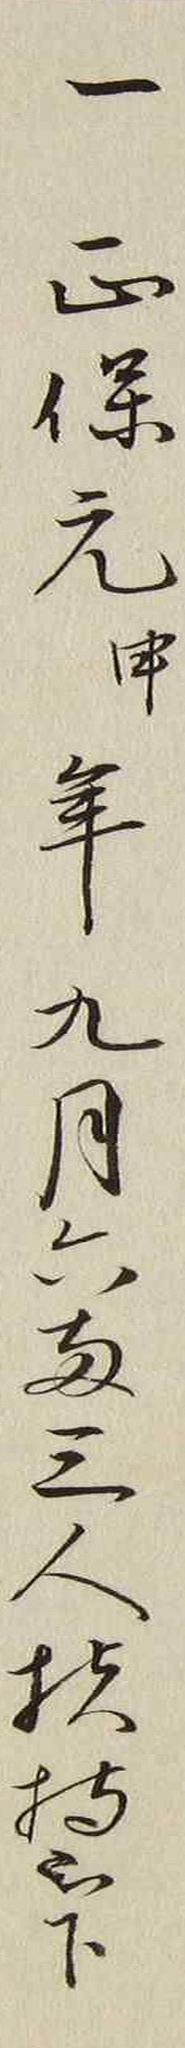一正保元申年九月六両三人扶持被下
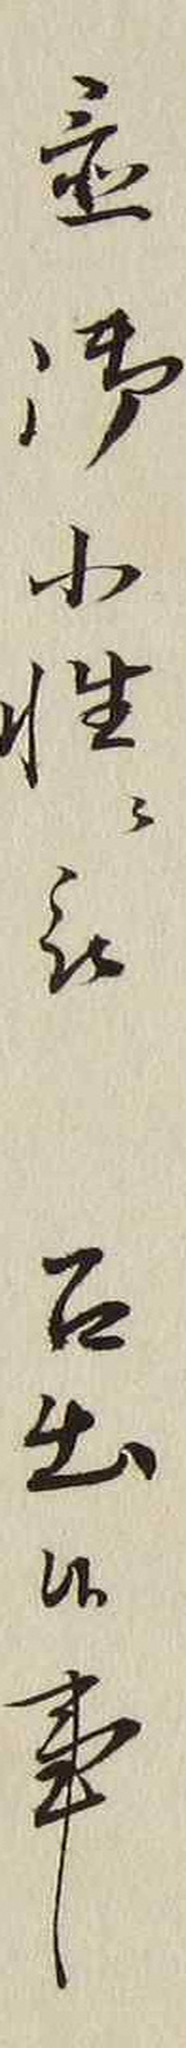置御小性ニ被召出候事
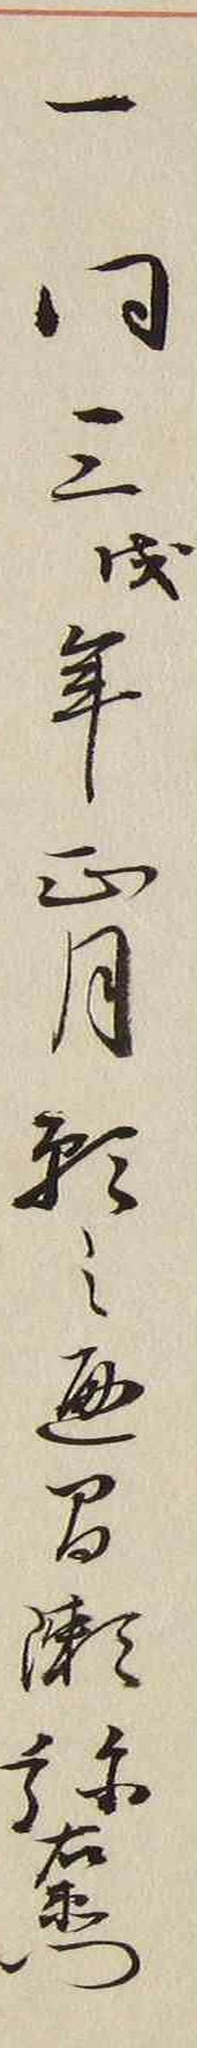一同三戌年正月願之通間瀬弥右衛門
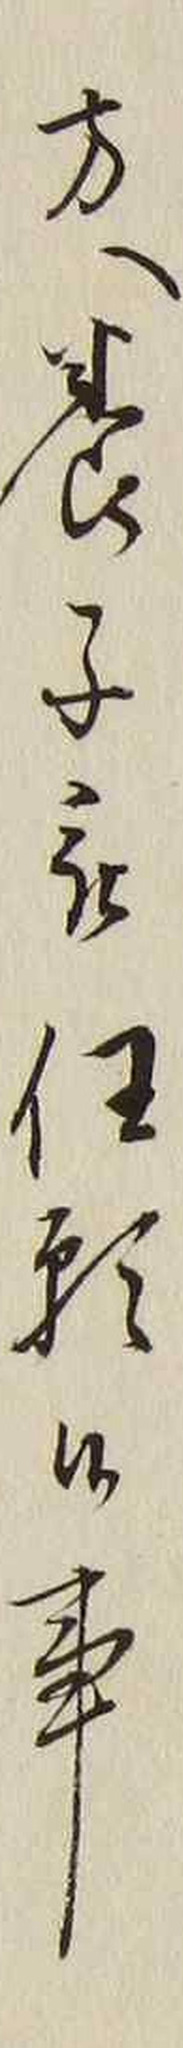方へ養子被任願候事

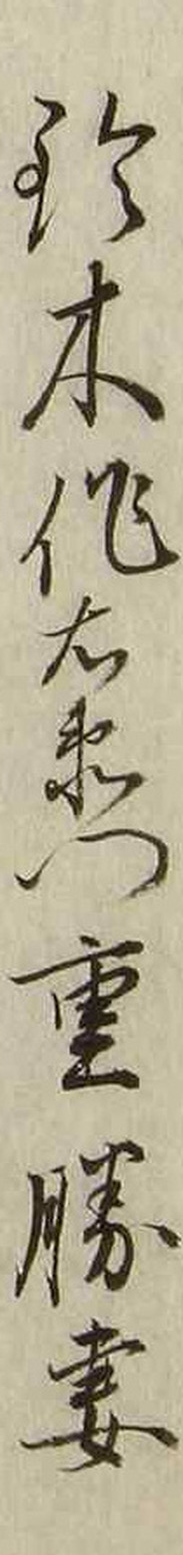女鈴木作右衛門重勝妻
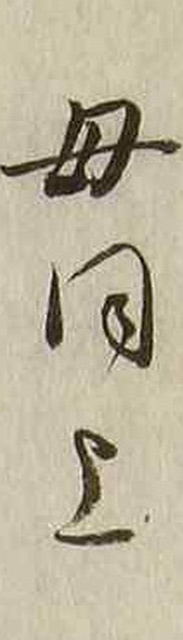母同上
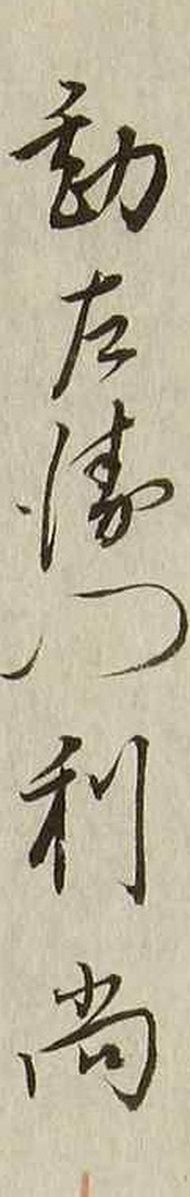勘左衛門利尚
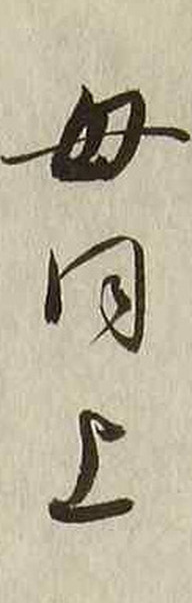母同上
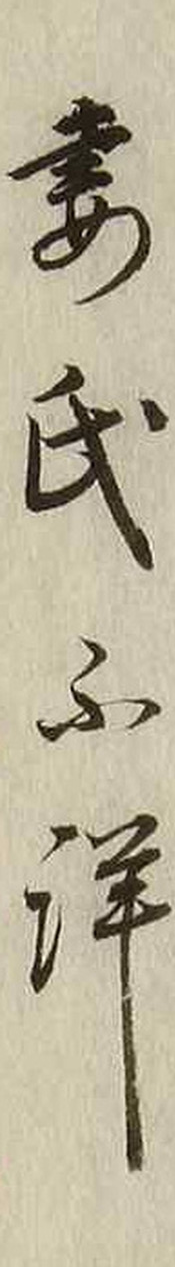妻氏不詳
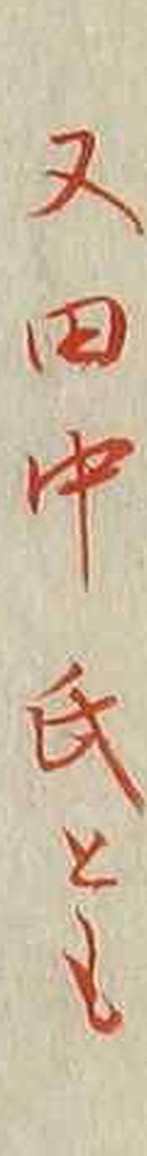又田中氏とも
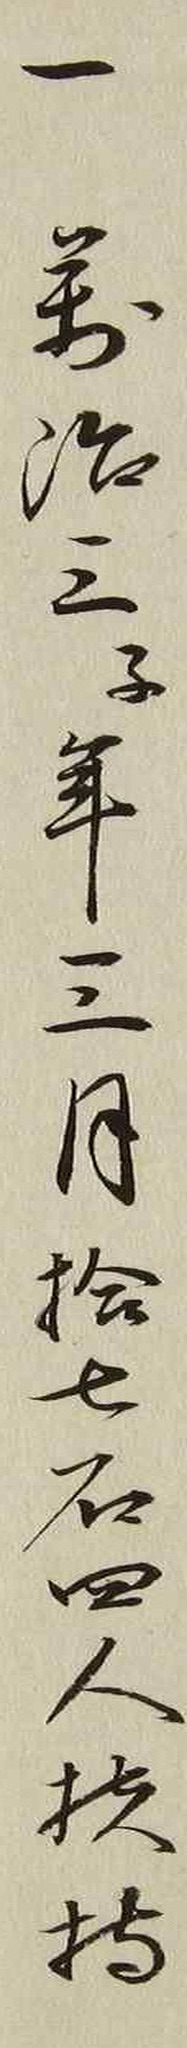一万治三子年三月拾七石四人扶持
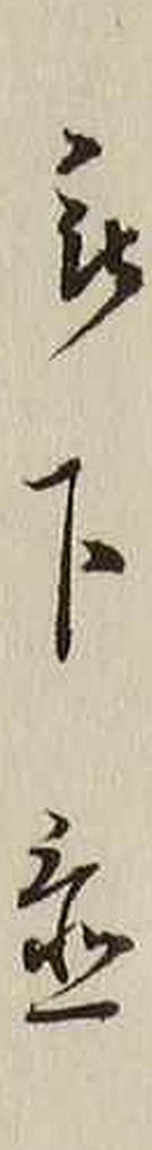被下置
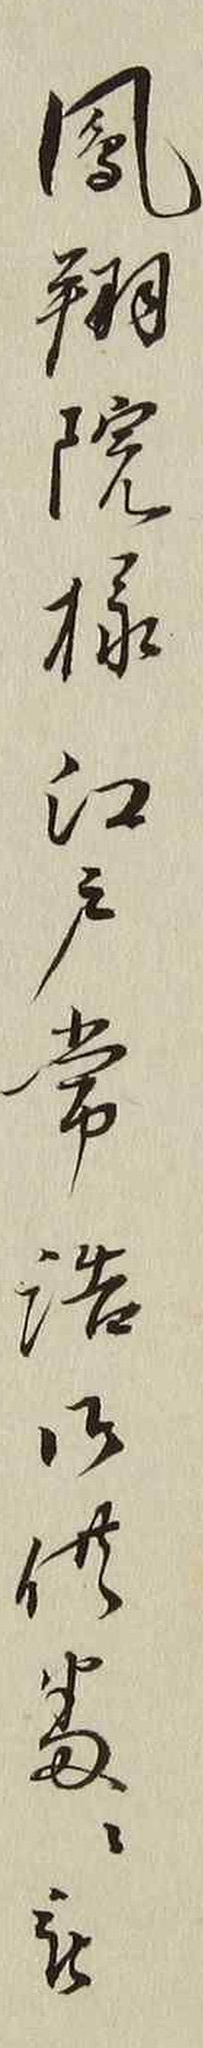鳳翔院様江戸常詰御供番ニ被
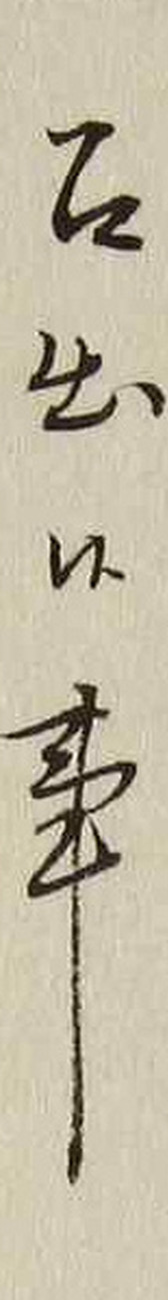召出候事
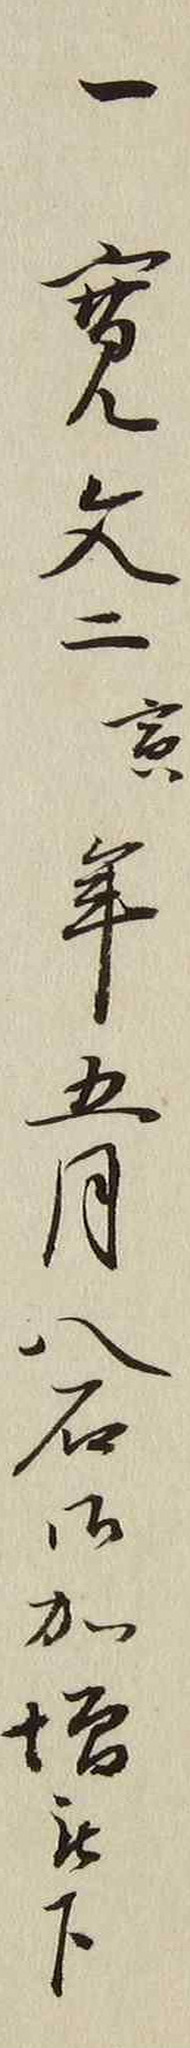一寛文二寅年五月八石御加増被下
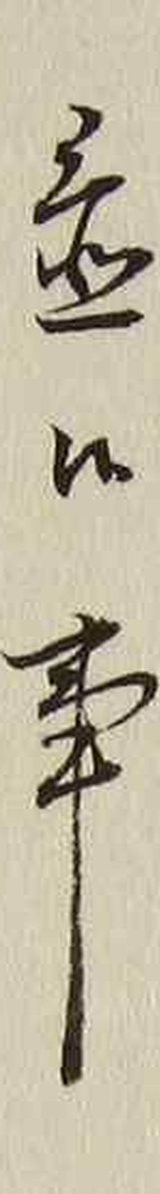置候事
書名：諸士系譜　巻之22　い之部22
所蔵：会津若松市立会津図書館
